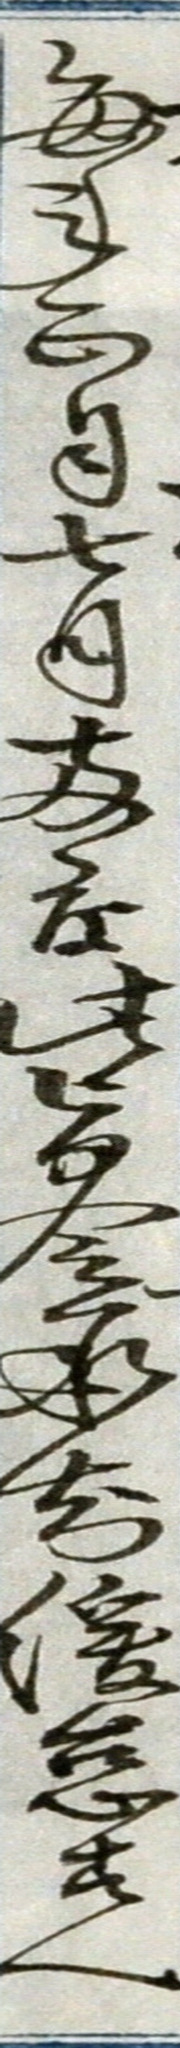毎年正月七日両度此旨合承知緩怠すへ
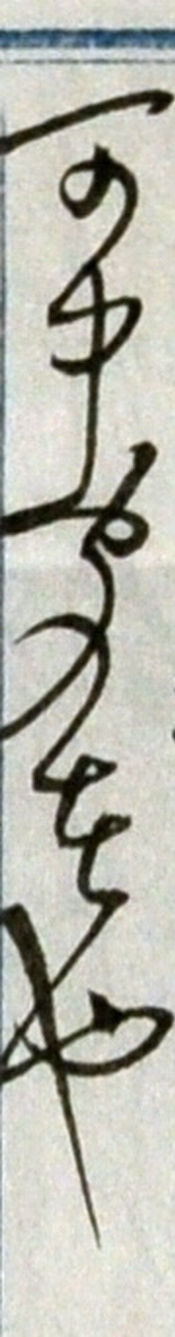可申聞者也
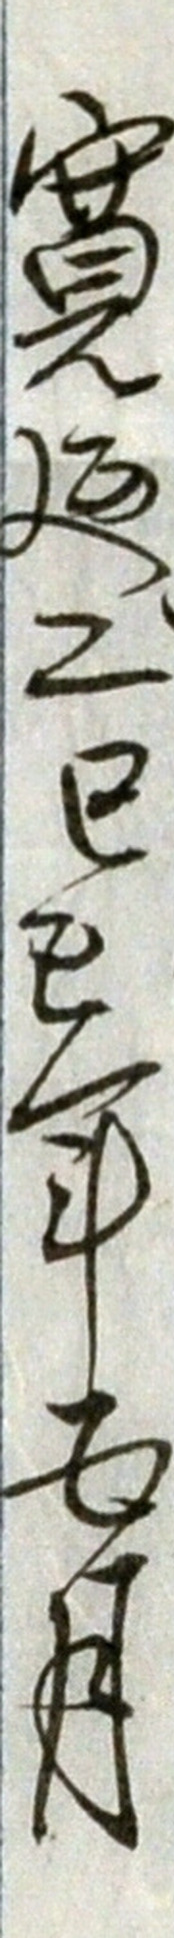寛延二己巳年五月
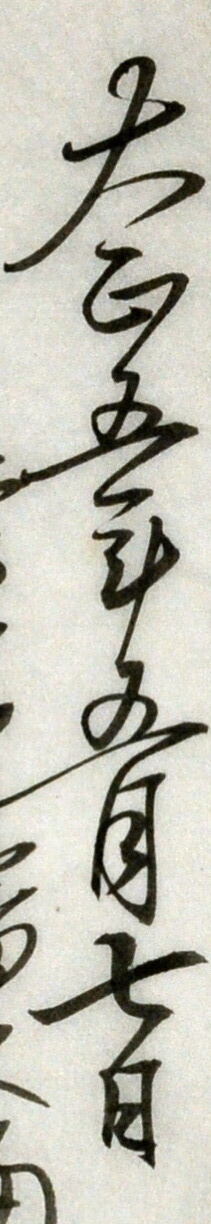大正五年五月七日
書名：頼由公御定書
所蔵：伊那市立高遠町図書館・合同会社AMANE
